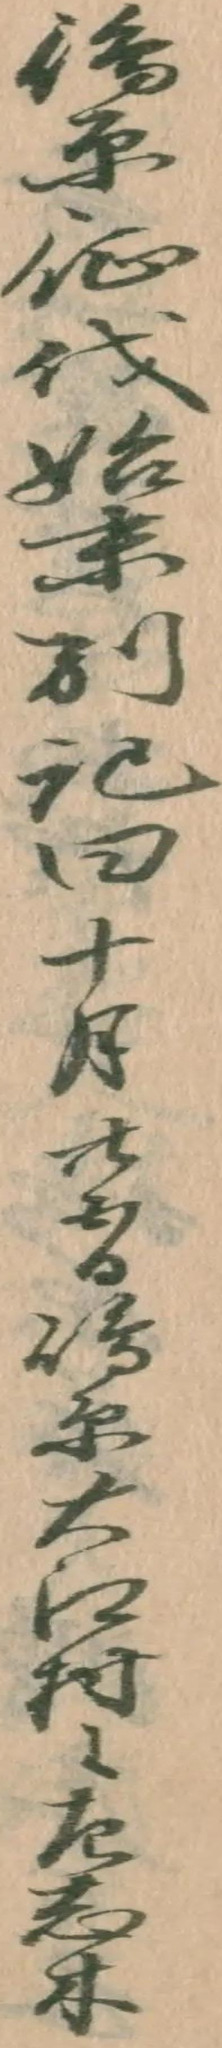島原征伐始末別記日十月廿五日島原大江村に左志木
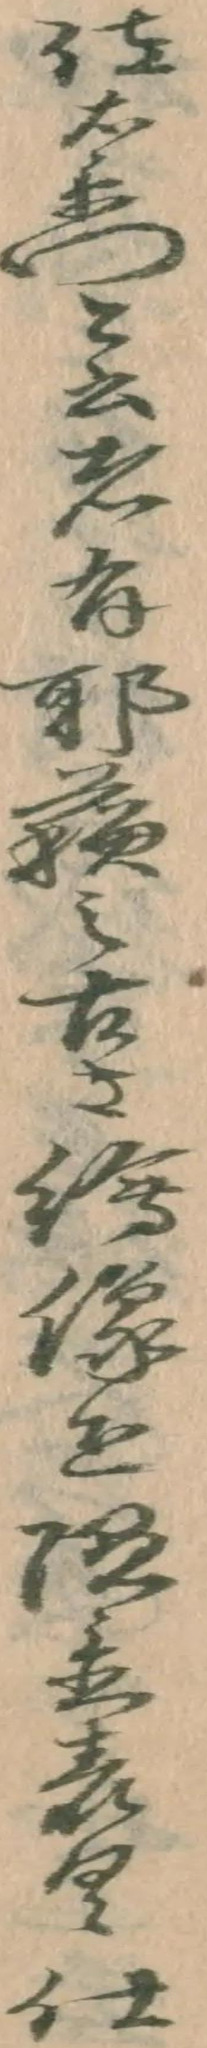佐右衛門と云者耶蘇之古き絵像を隠置表具仕
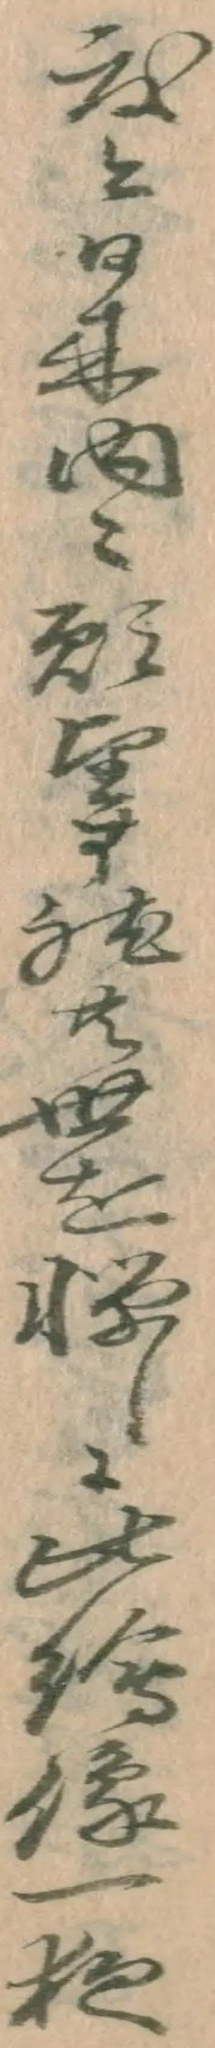度と日来内に願望す然共世を憚しに此絵像一夜
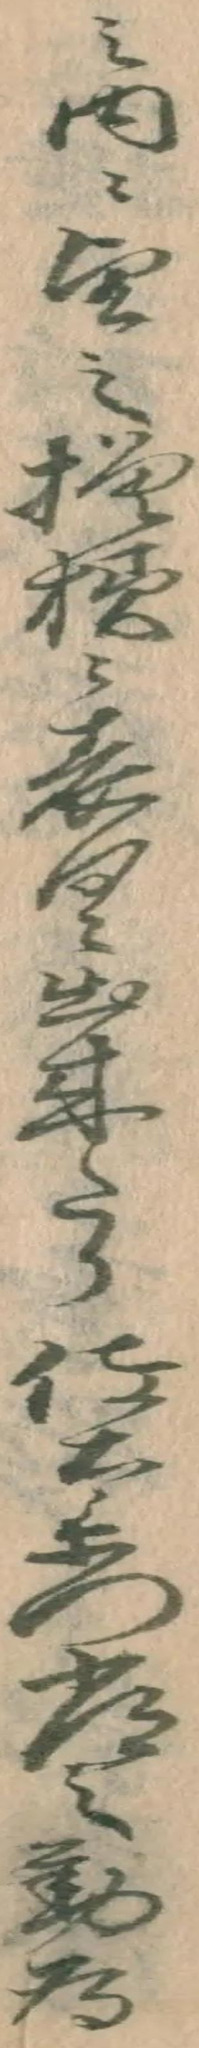之内に望之模様に表具出来たり佐右衛門常之勤為
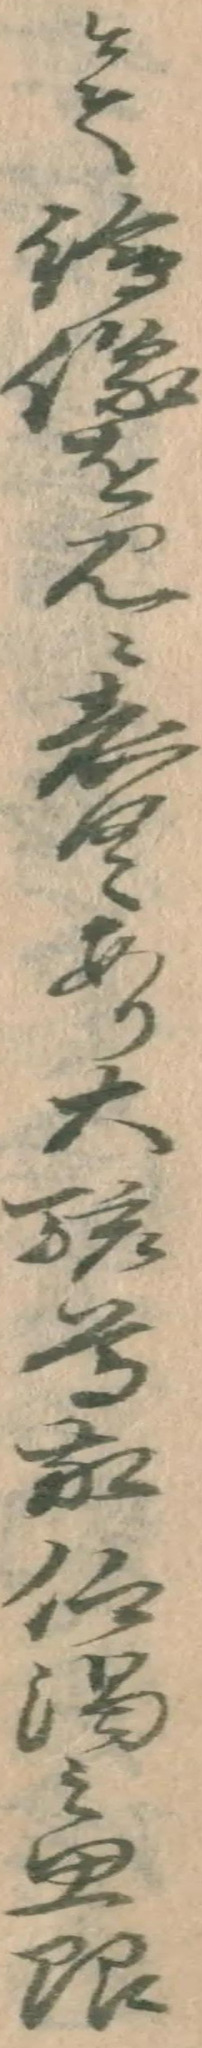とて絵像を見に表具あり大験尊我仏偈之思限
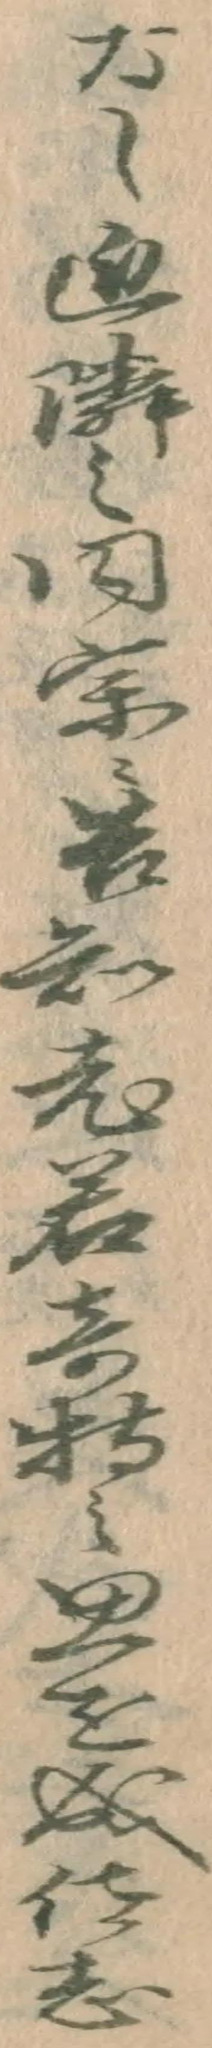なし近隣之内余に告知老若奇特之思を成佐志
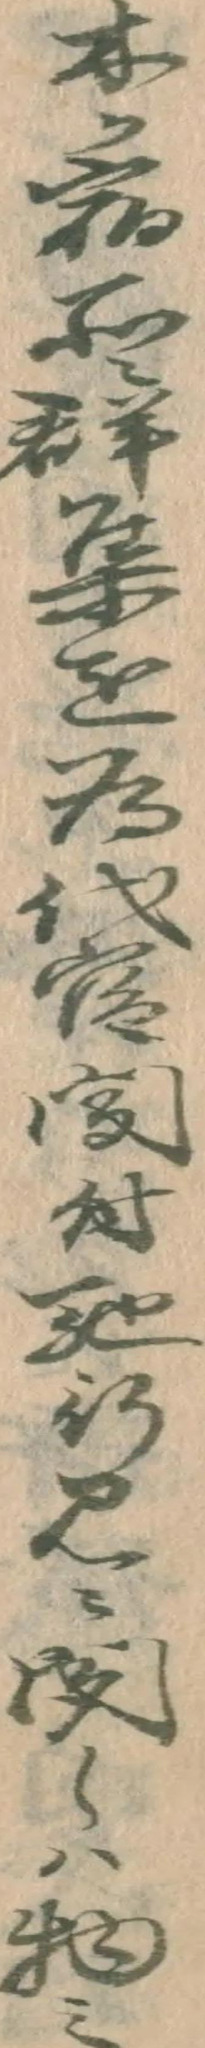木か宿所に群集を為代官聞付馳行見に聞しは物之
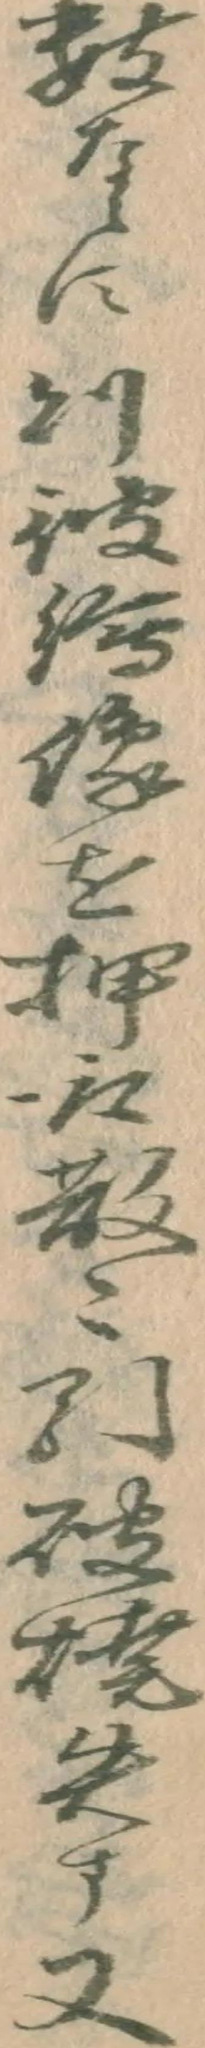数ならす則彼絵像を押取散々引破焼失す又
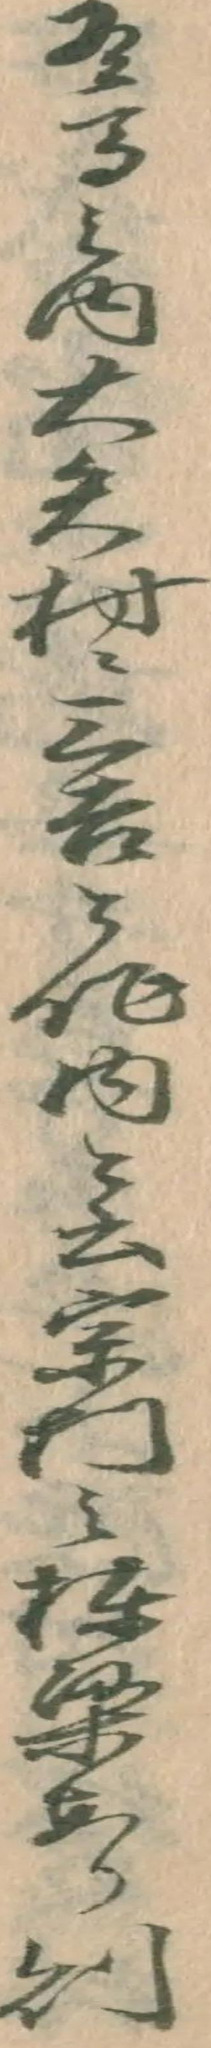有馬之内大矢村に三吉と作内と云宗門之棟梁あり則
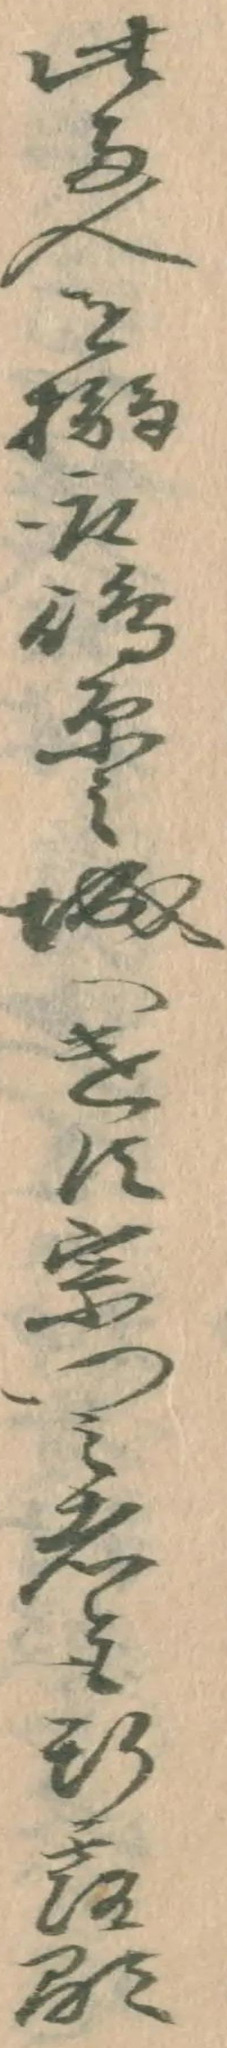此両人を搦取島原之城へ遣す宗門之者とも斯露顕

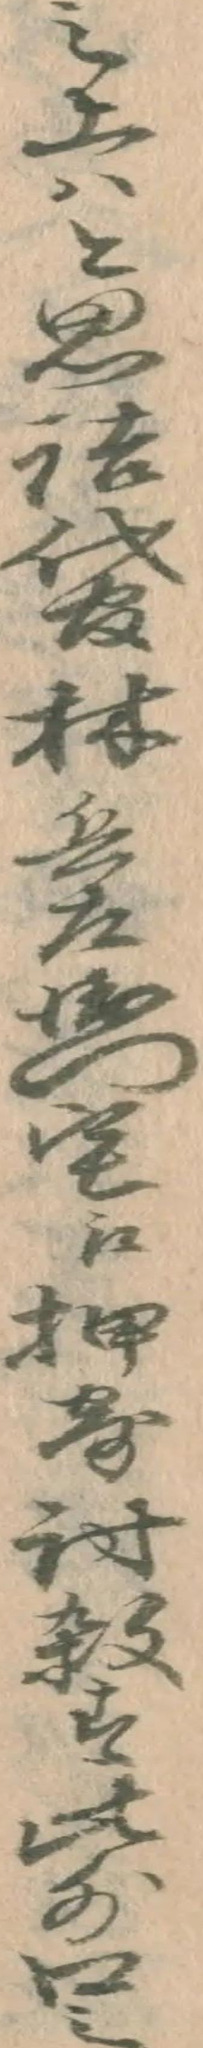上はと思詰代官林兵左衛門宅え押寄討殺す此仍口之
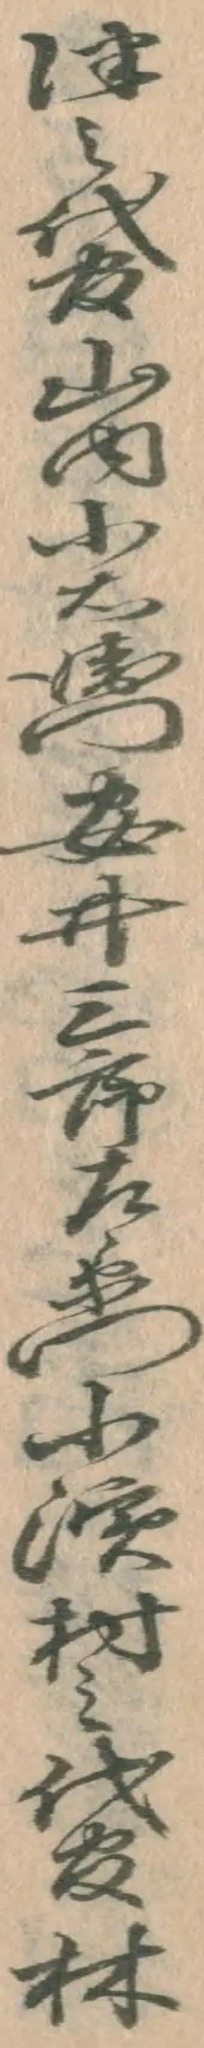津之代官山田小右衛門安井三郎左衛門小浜村之代官林
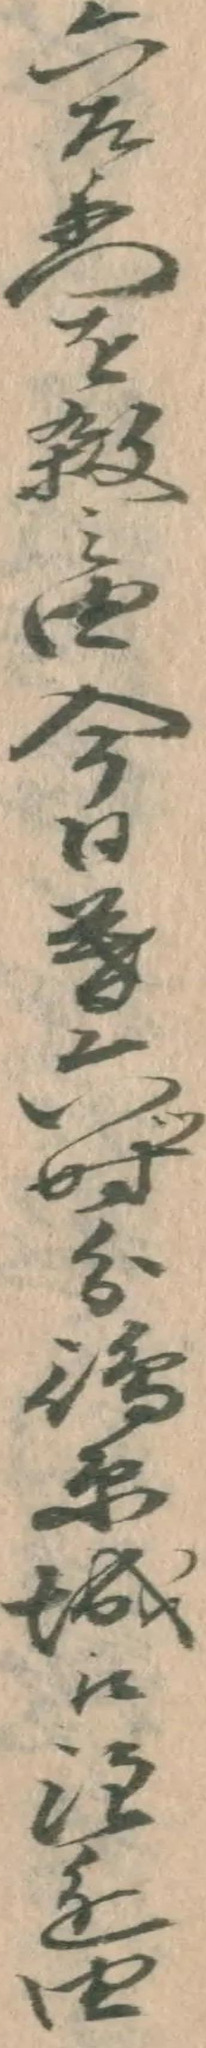六左衛門を殺之由今日暮六つ時分島原城え注進由
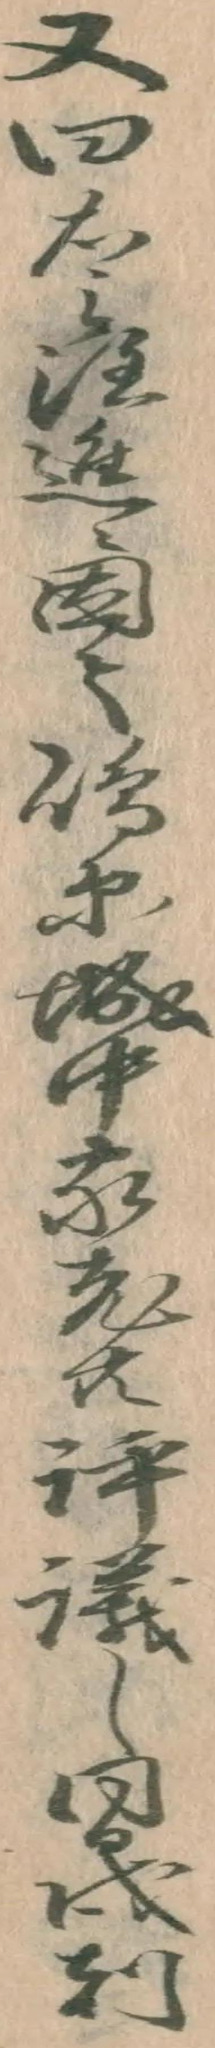又日右之注進に因て島原城中家老共評議し同日戌刻
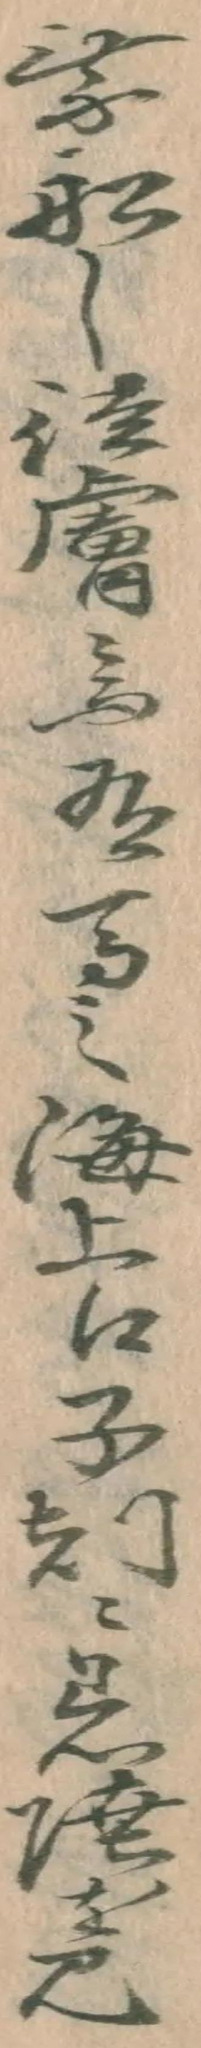乗船し徒膚に而有馬之海上え子刻に着陸を見
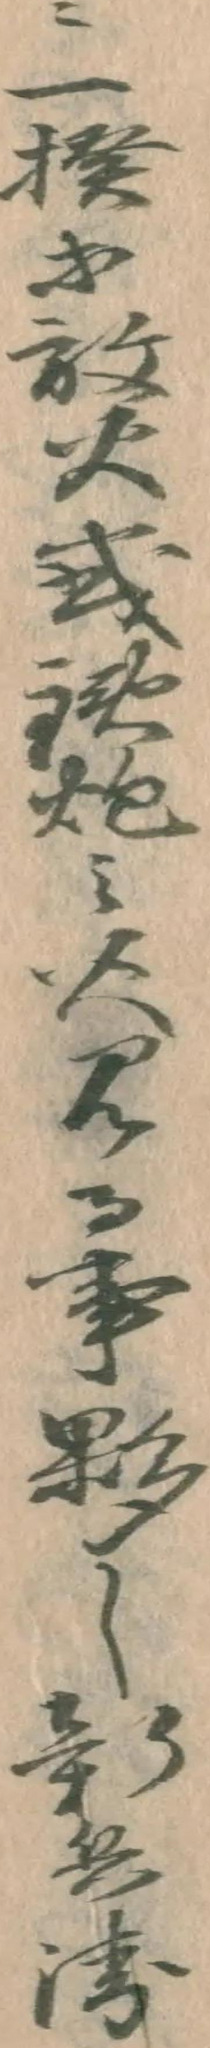に一揆方放火或鉄炮之火見る事夥し新兵衛
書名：切支丹御退治記 49巻. [1]
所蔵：国立国会図書館 National Diet Library, JAPAN
